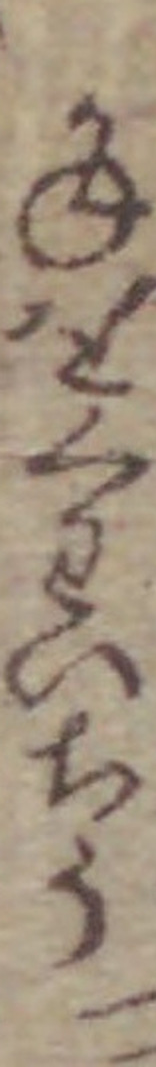かねをくわいちう
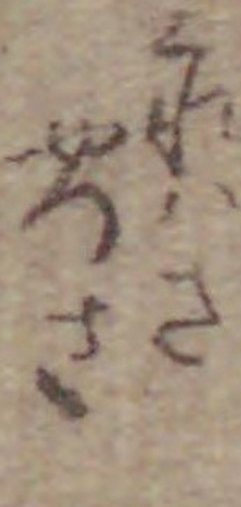やつさ
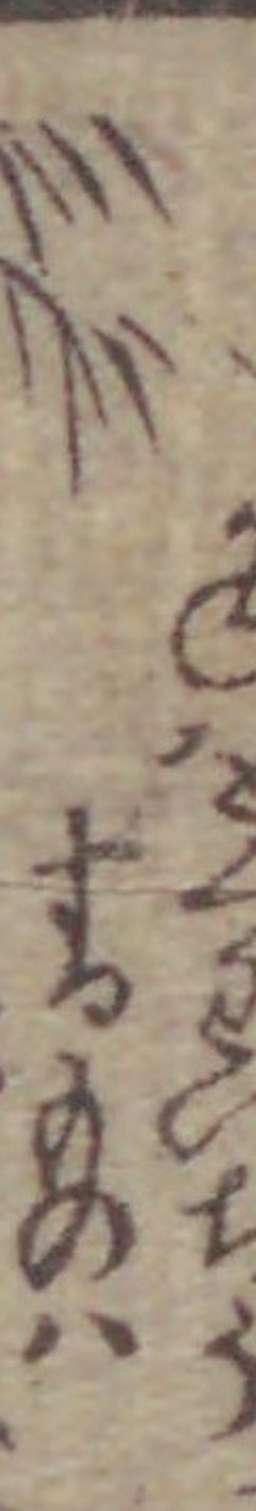するものは
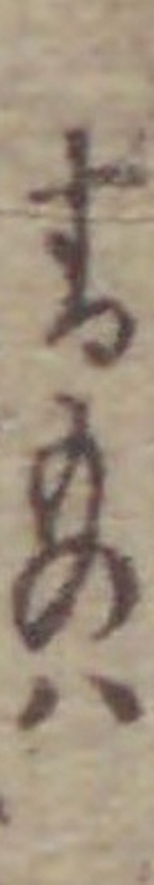するものは
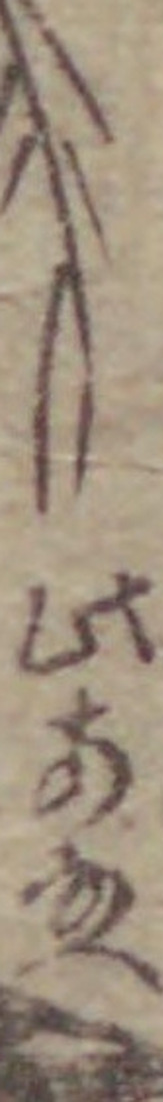此あなへ
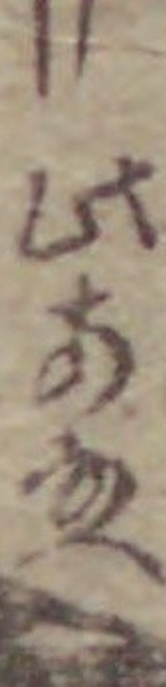此あなへ
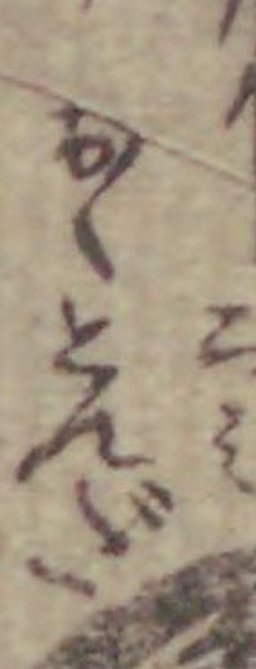おくとんだ
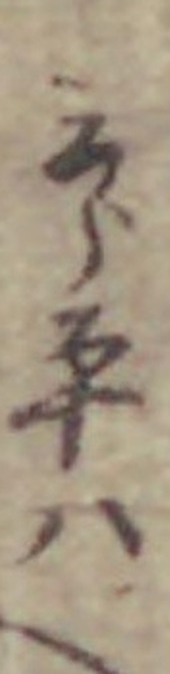三郎平は
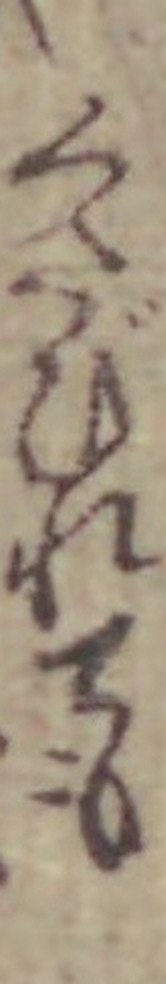くたびれても
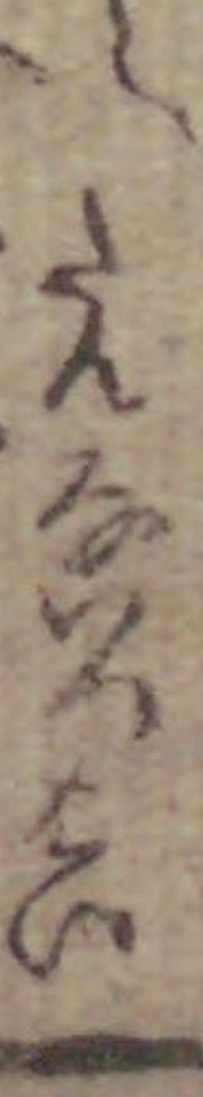たんないつはい
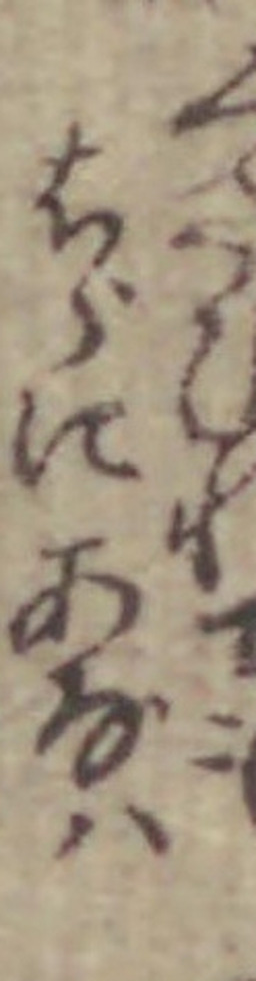はらにあなは
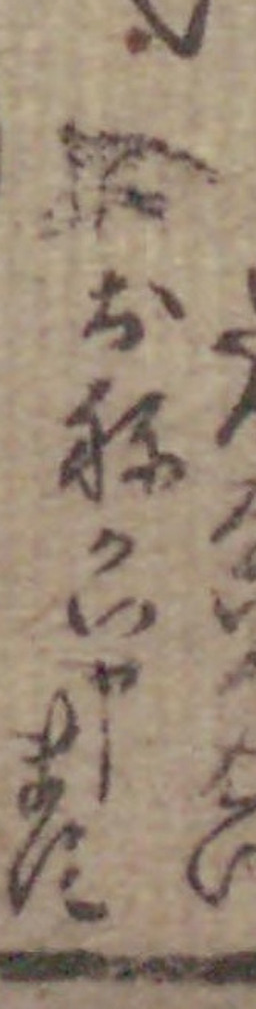おねかい申し
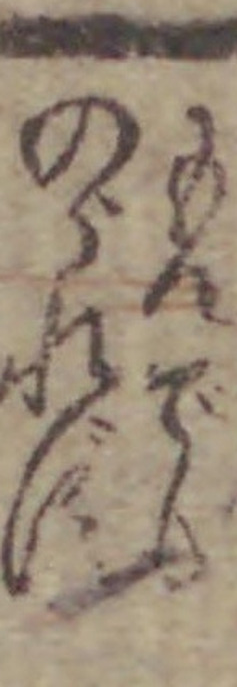のられず
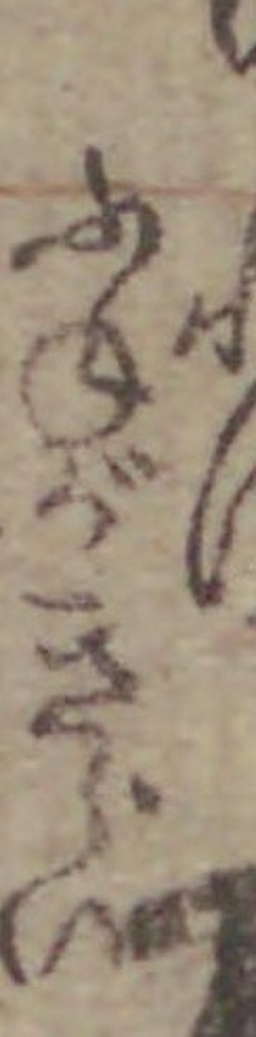ふねがきらい
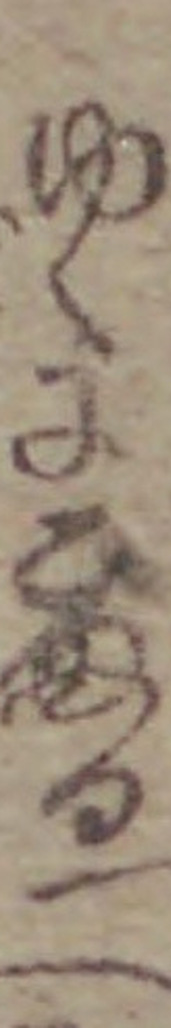ゆくにこまる
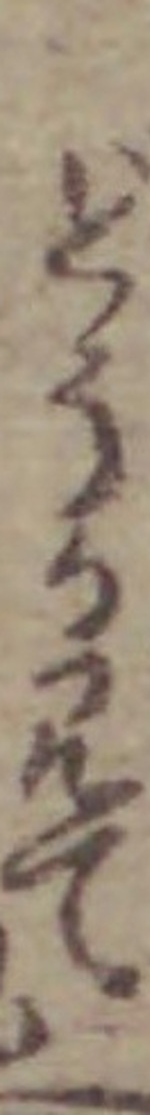どうか見ても
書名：近頃嶋めぐり 3巻
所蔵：国立国会図書館 National Diet Library, JAPAN
